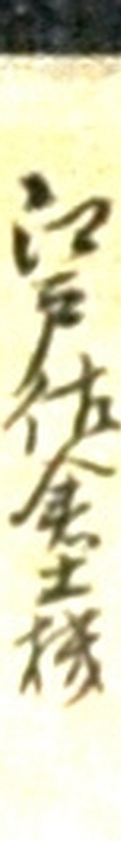江戸佐倉土機
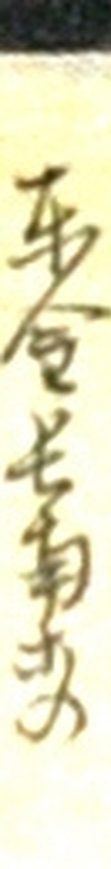東金長南等の
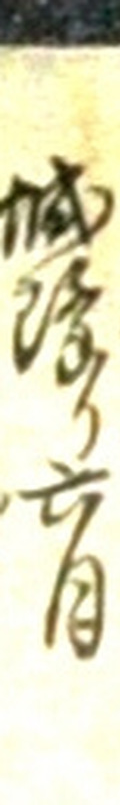城降り六月
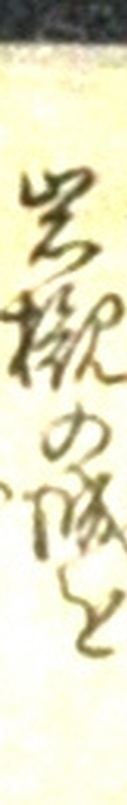岩槻の城を
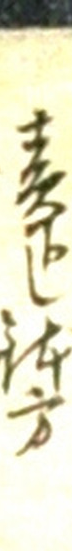責下し鉢方
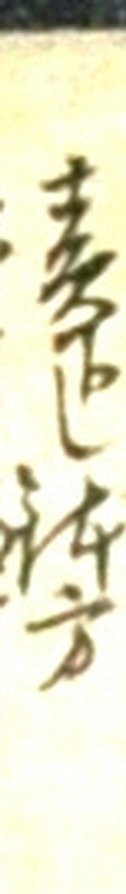責下し鉢方
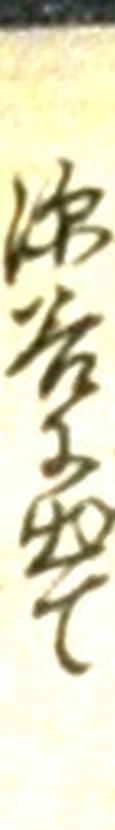深谷に出て
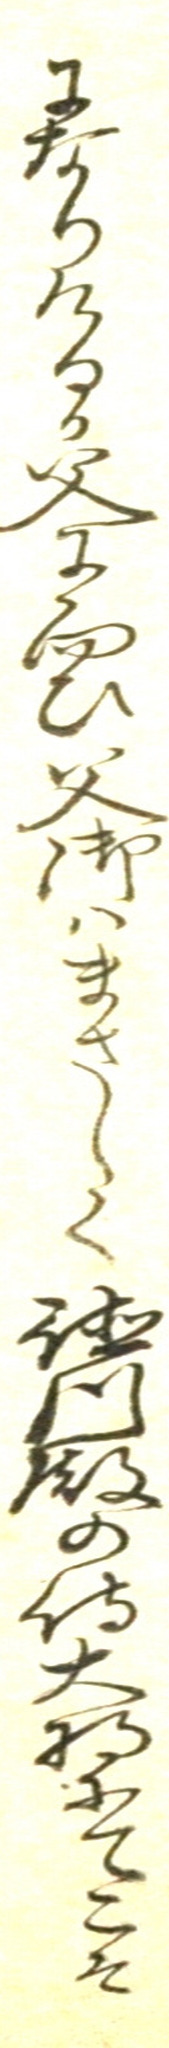になりけるか父に向ひ父御はまさしく徳川殿の侍大将にてこそ
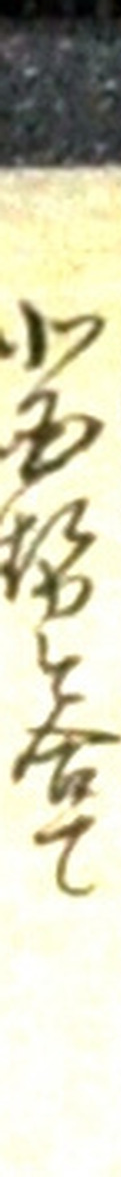北国勢と合て
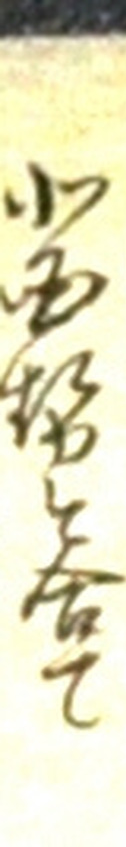北国勢と合て
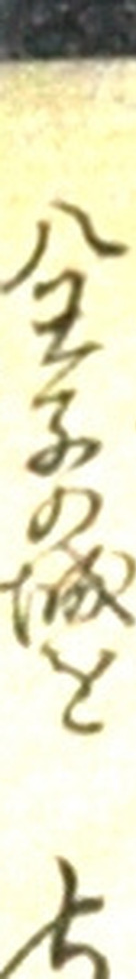八王子の城を
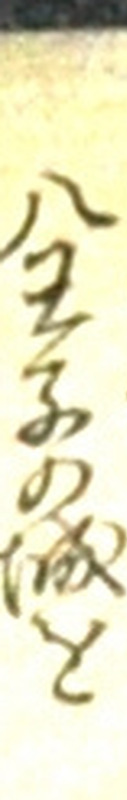八王子の城を
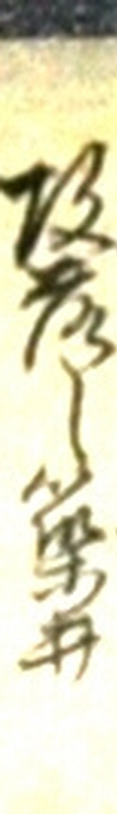攻落し築井
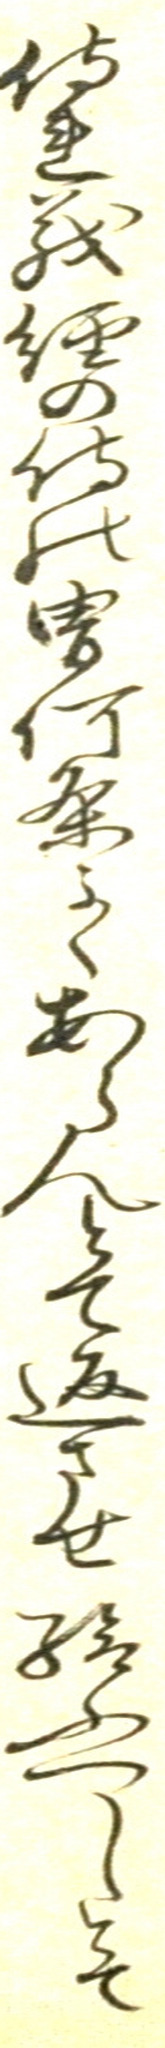侍れ義経の侍の冑何条よくあらんとて返させ給ふへしとて
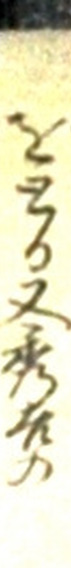をとる又秀吉の
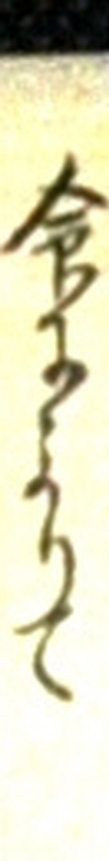命によりて
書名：藩翰譜（四・上）
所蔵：伊那市立高遠町図書館・合同会社AMANE
